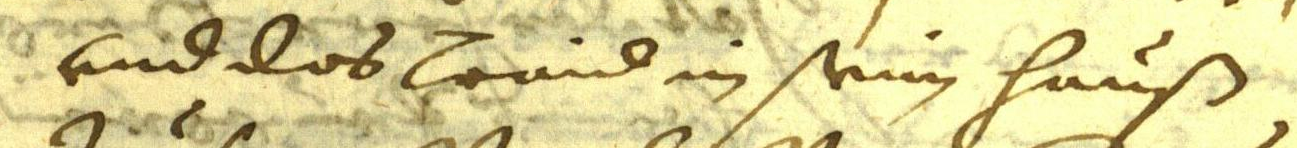vnd das Traid in sein Haūß
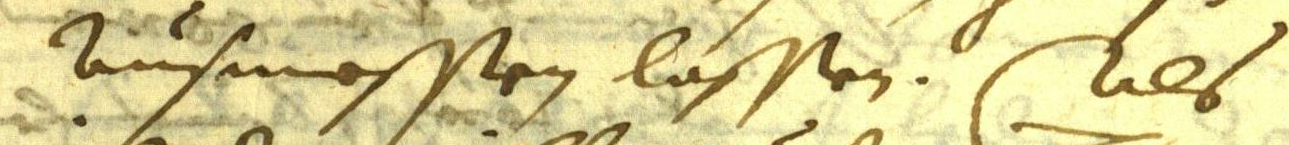Aūsmessen lassen. Als
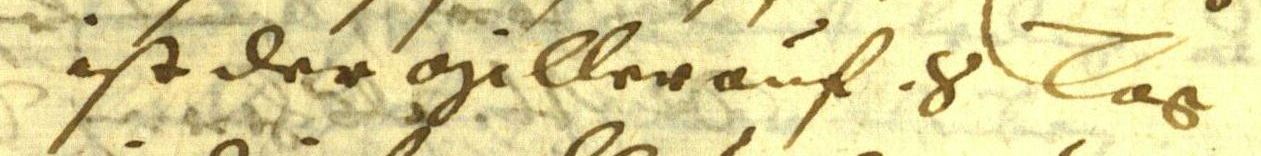ist der Miller aūf .8 Tag
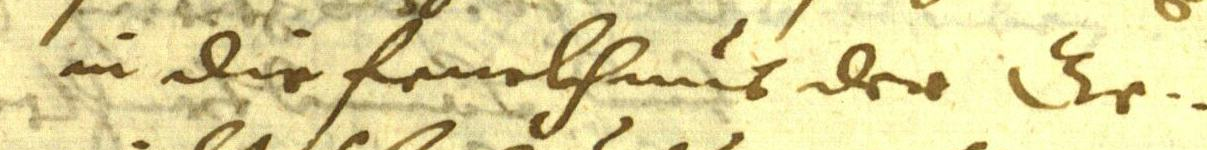in die fenckhnūs der Ge¬
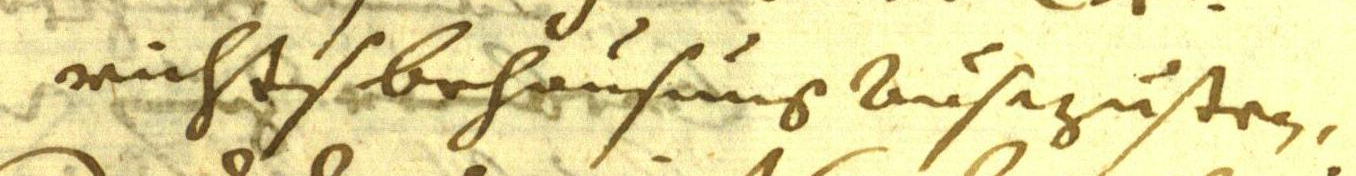richtsbehaūsūng Aūszūsten,
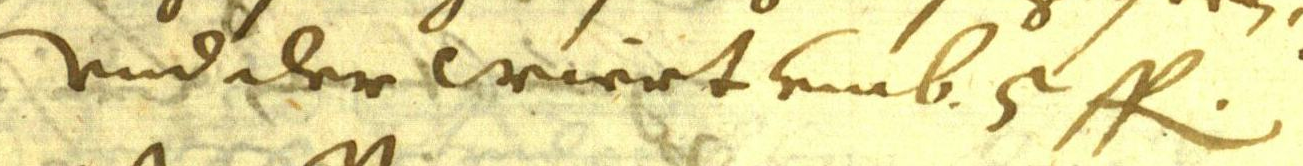vnd der wiert vmb 5 ff.
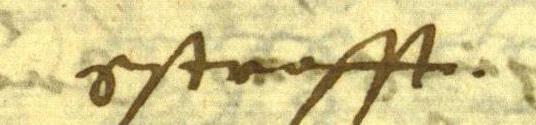gstrafft.
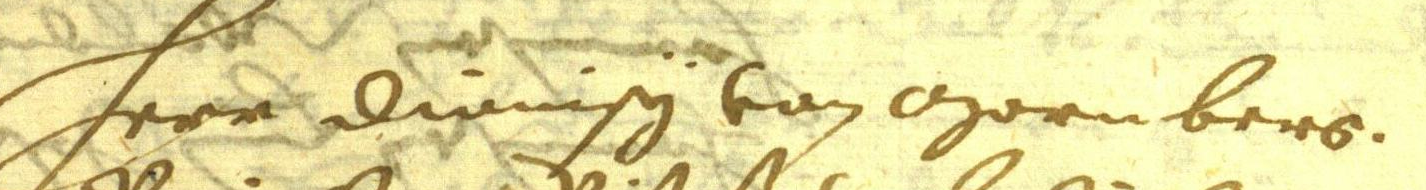Herr Dionisÿ von Mornberg.
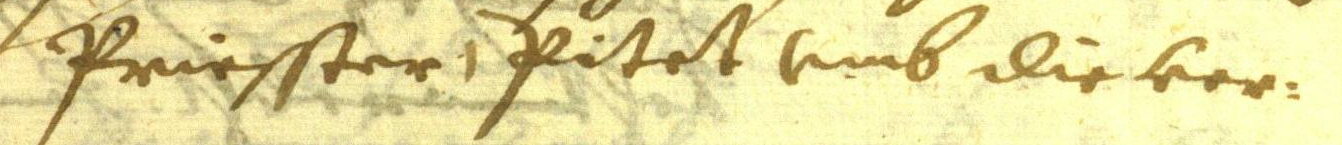Priesster, Pitet vmb die ver¬
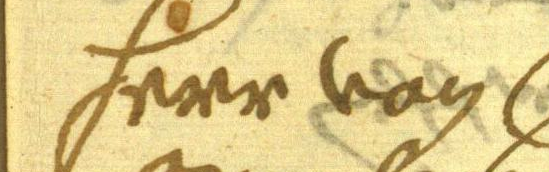Herr von
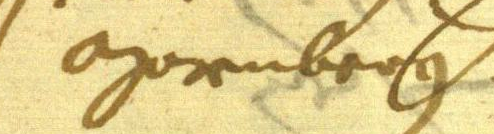Mornberg.
